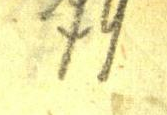79
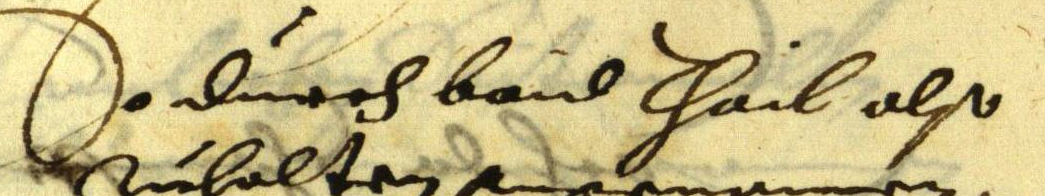So dūrch baid Thail also
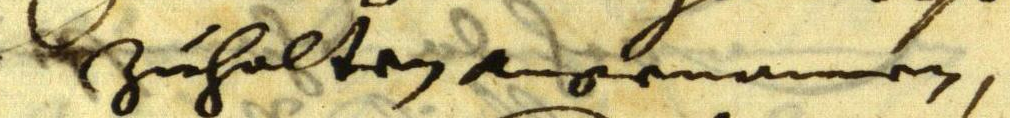Zūhalten angenomen,
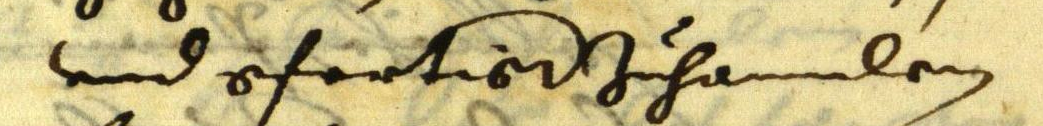vnd gfertigt Zūhannden
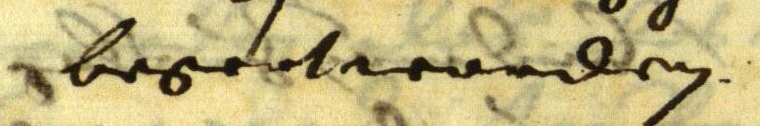begert worden.
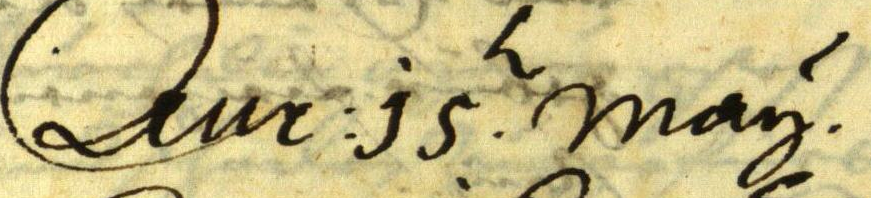Am: 15.t Maȳ.
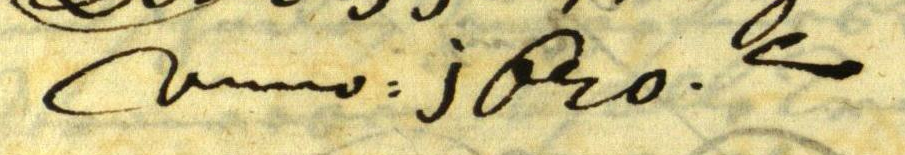Anno: 1620.t
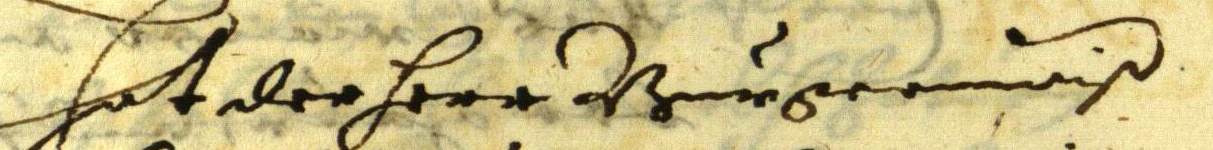Hat der herr Būrgermaist
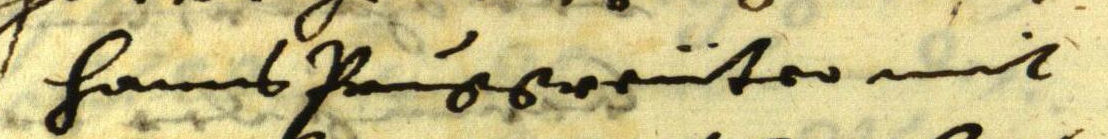hanns Prūggreüter mit
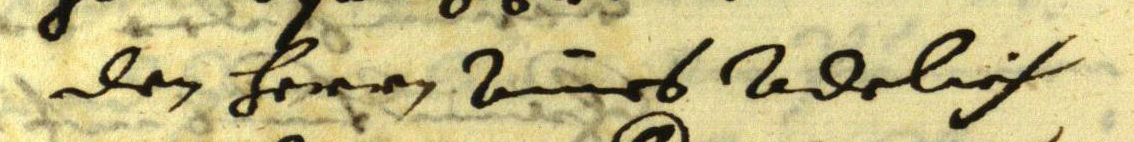den herrn Aines Adelich
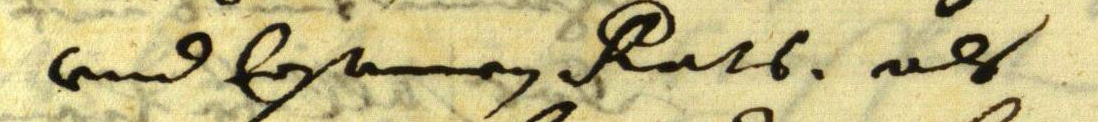vnd Ersamen Rats. als
